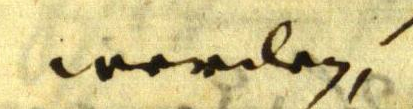werden,
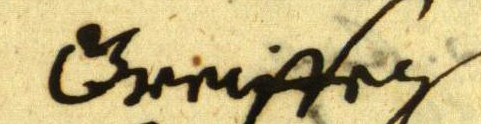Greiffen
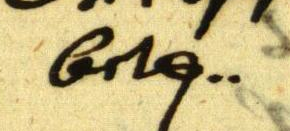bet:
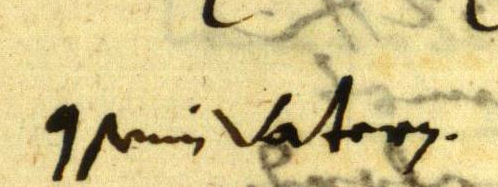sein Vatern.
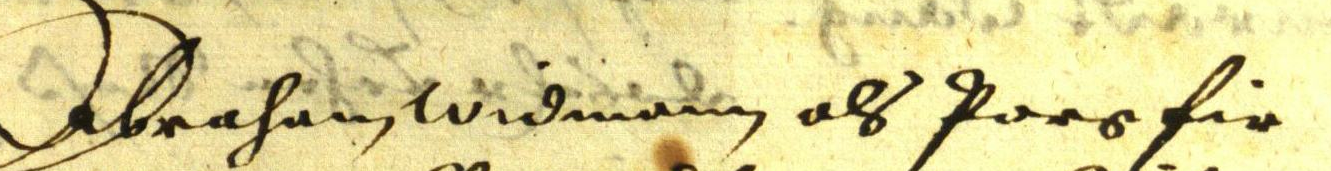Abraham Widmann als Porg fir
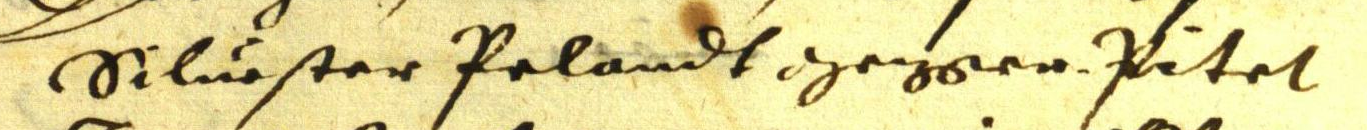Schūester Pelandt Metzger. Pitet
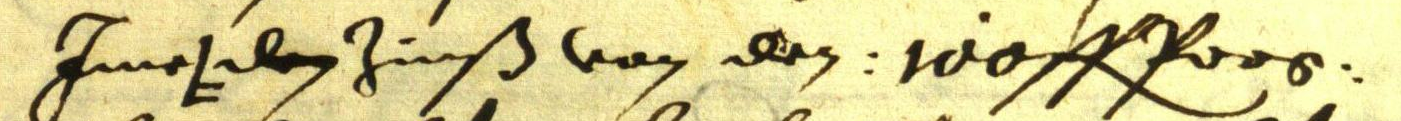Ime den Zinß von den: 100 fl Porg¬
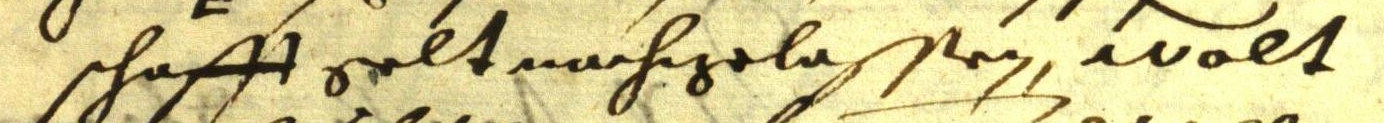schafft gelt nachzelassen, wolt
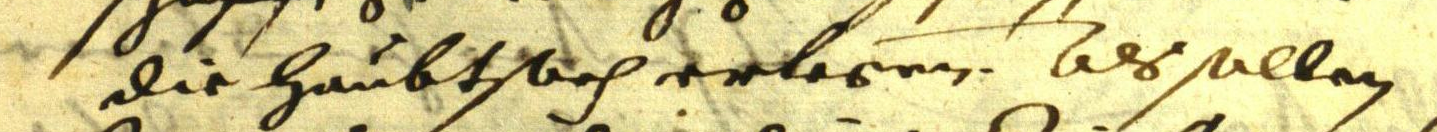die Haūbtsach erlegen. Als sollen
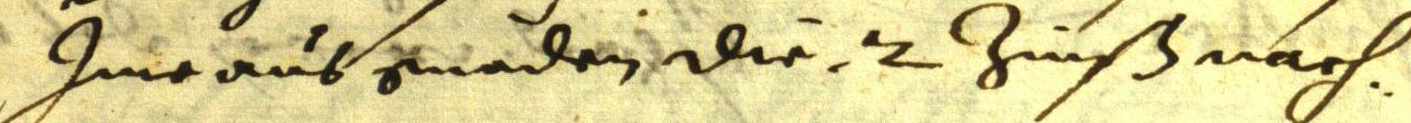Ime aūs gnaden die .2 Zinß nach¬
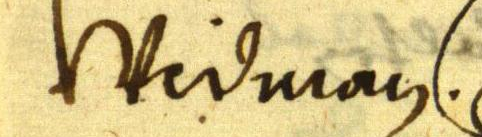Widman.
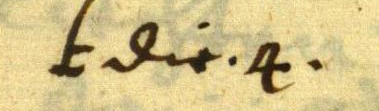die .4.
